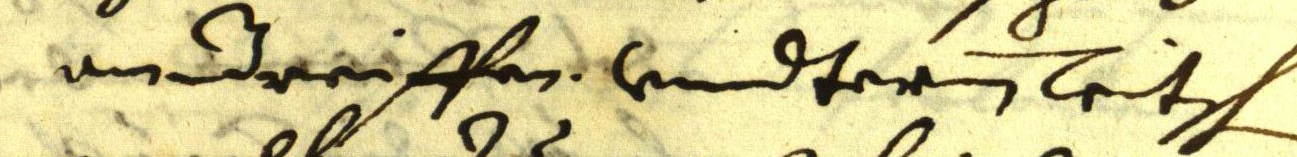am Greiffen. vndtern Teitsch
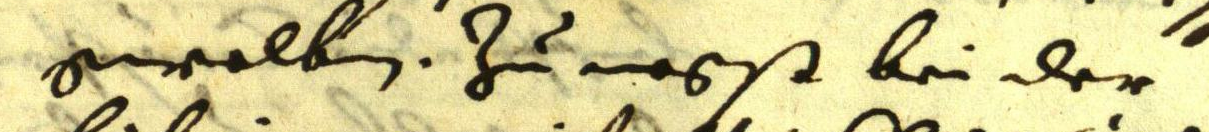gwelbn. Zū negst bei der
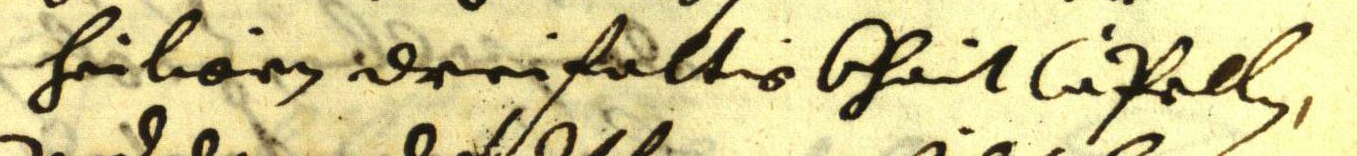heiligen dreifaltig khait Capelln,
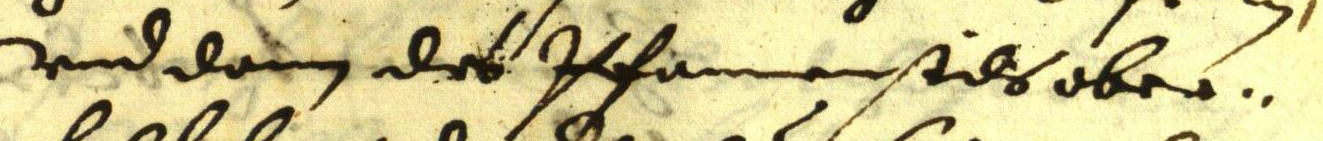vnd dann des Pfannenstil ober¬
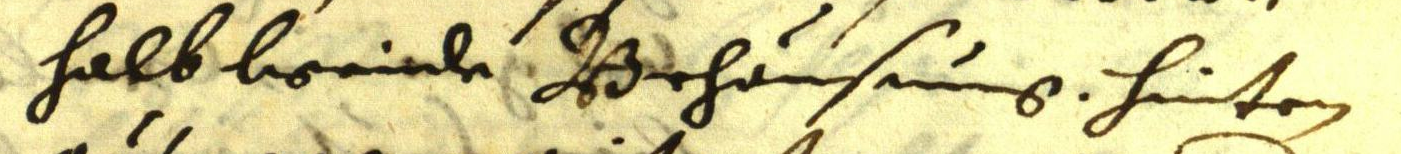halb liegende Behaūsūng. hinten
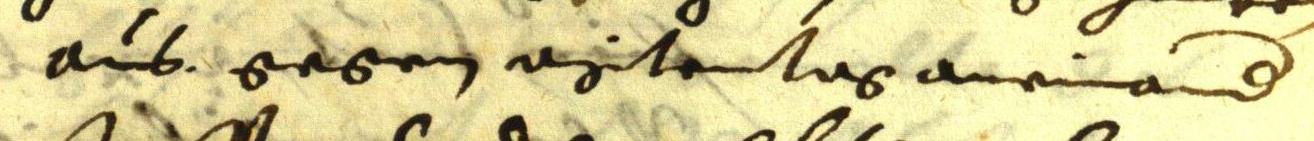aūs. gegen Mitentag aneinand
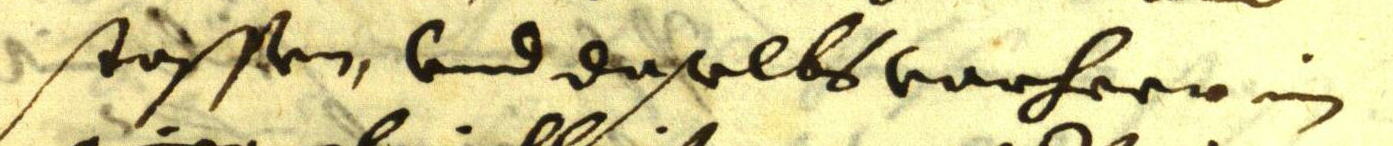stossen, vnd daselbs vorher in
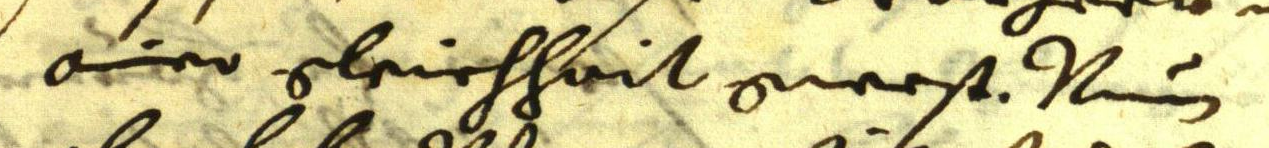ainer gleichhait gweest. Nūn
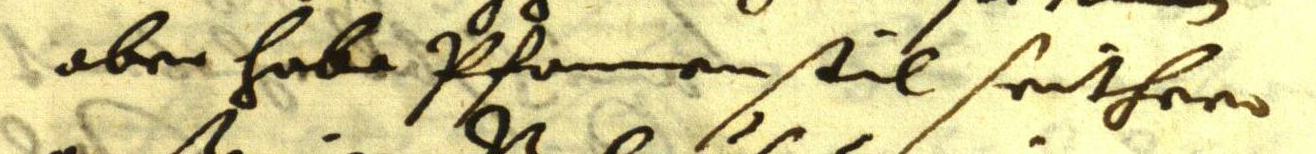aber habe Pfannenstil seither
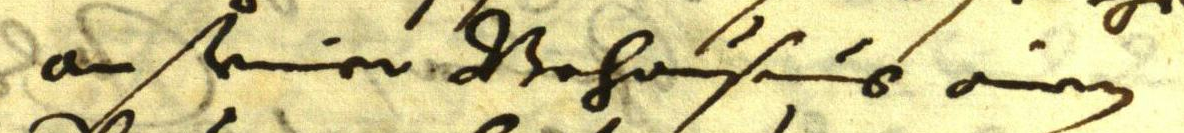an seiner Behaūsūng ainen
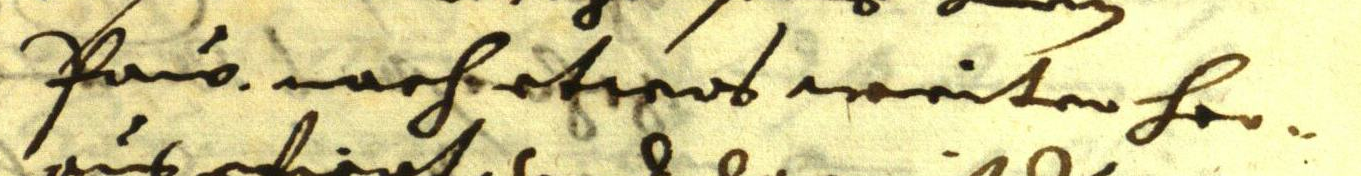Paw̄. noch etwas weiter her¬
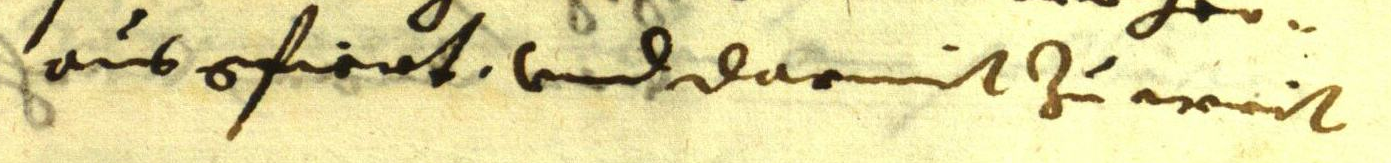aūs gefiert. vnd darmit Zū weit
